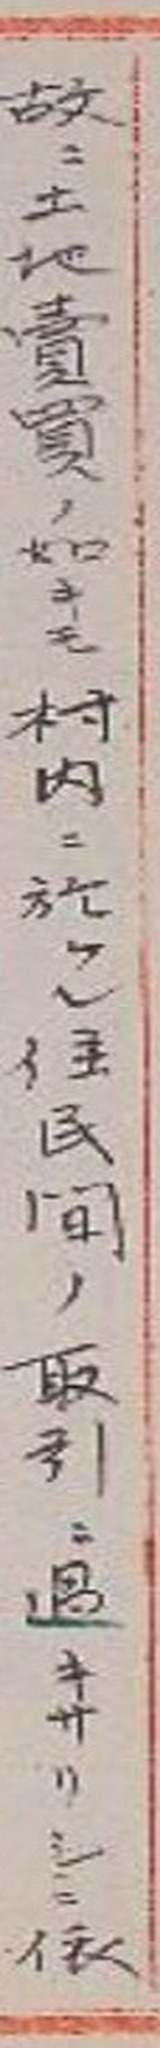故ニ土地売買ノ如キモ村内ニ於ケル住民間ノ取引ニ過キサリシニ依
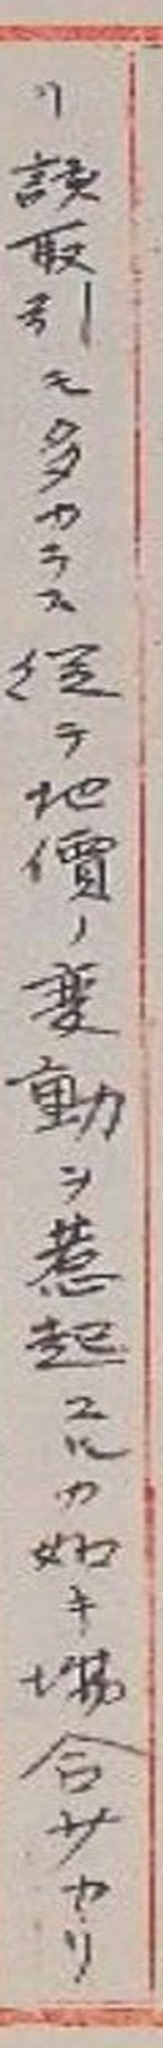リ該取引モ多カラス従テ地価ノ変動ヲ惹起スルカ如キ場合ナカリ
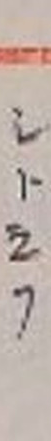シト云フ
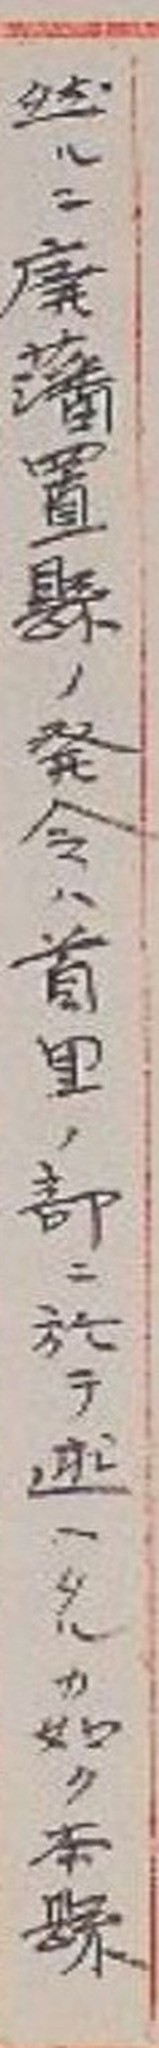然ルニ廃藩置県ノ発令ハ首里ノ部ニ於テ述ヘタルカ如ク本県
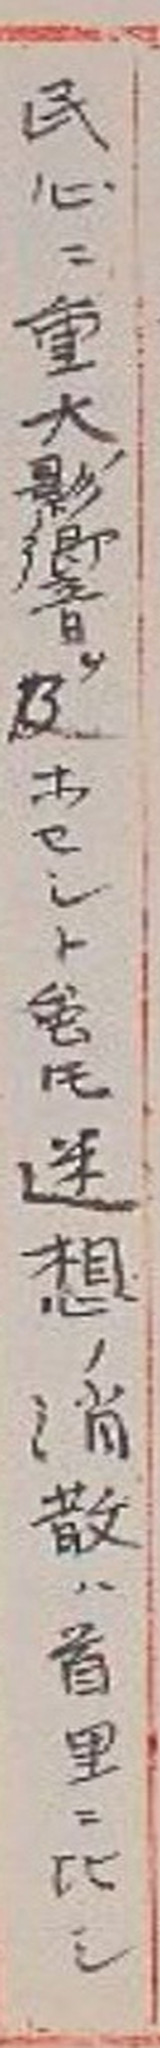民心ニ重大ノ影響ヲ及ホセシト雖トモ迷想ノ消散ハ首里ニ比シ
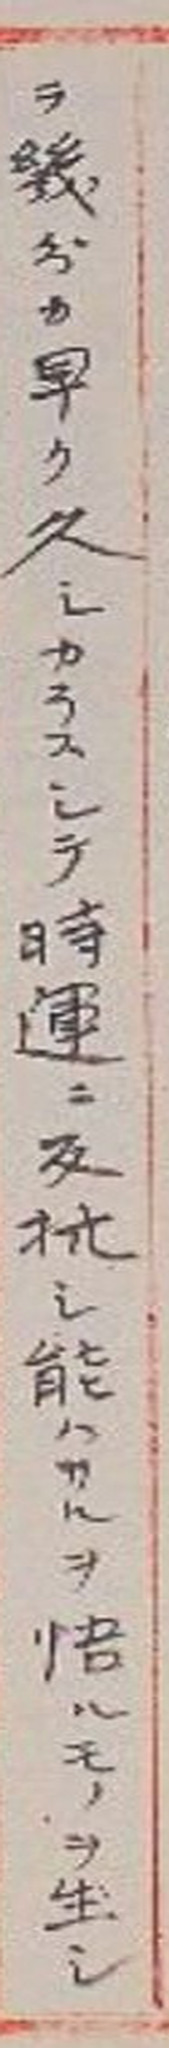テ幾分カ早ク久シカラスシテ時運ニ反抗シ能ハサルヲ悟ルモノヲ生シ
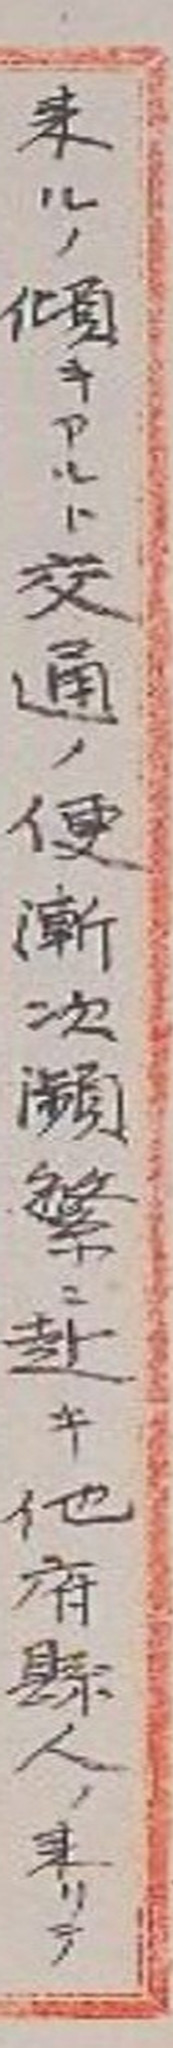来ルノ傾キアルト交通ノ便漸次瀕繁ニ赴キ他府県人ノ来リテ
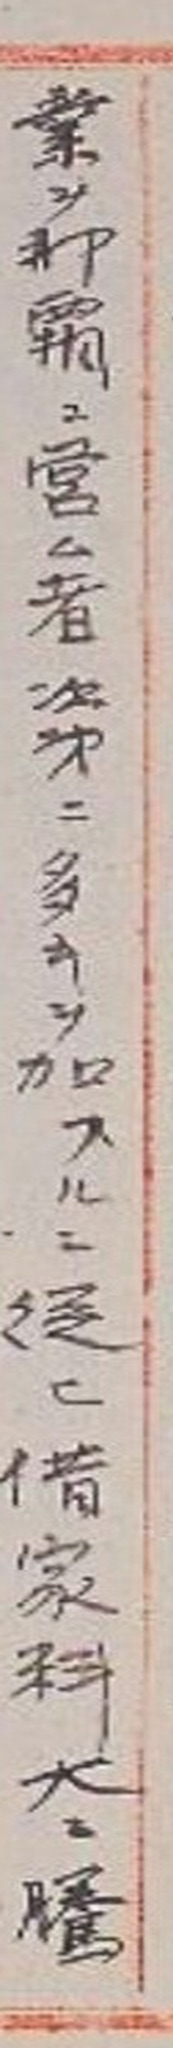業ヲ那覇ニ営ム者次第ニ多キヲ加フルニ従ヒ借家料大ニ騰
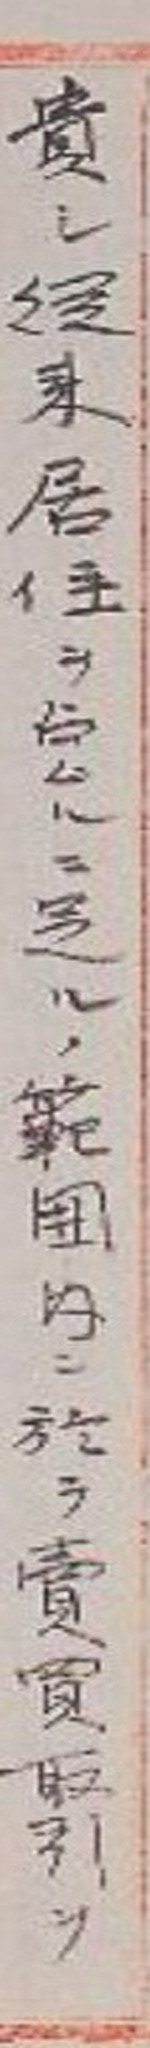貴シ従来居住ヲ占ムルニ足ルノ範囲内ニ於テ売買取引ヲ
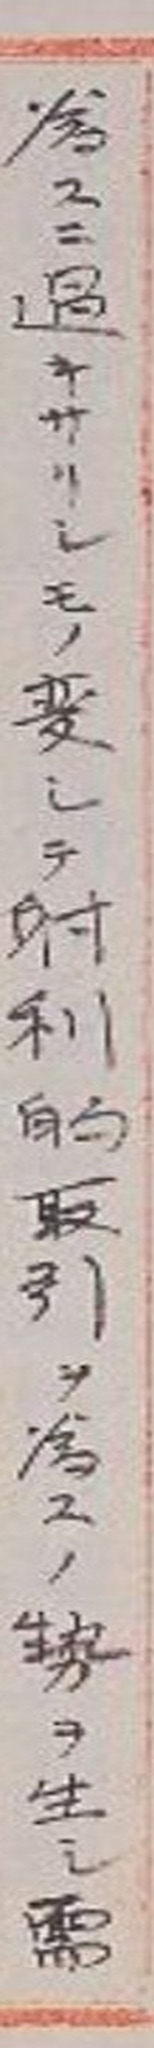為スニ過キサリシモノ変シテ射利的取引ヲ為スノ勢ヲ生シ需
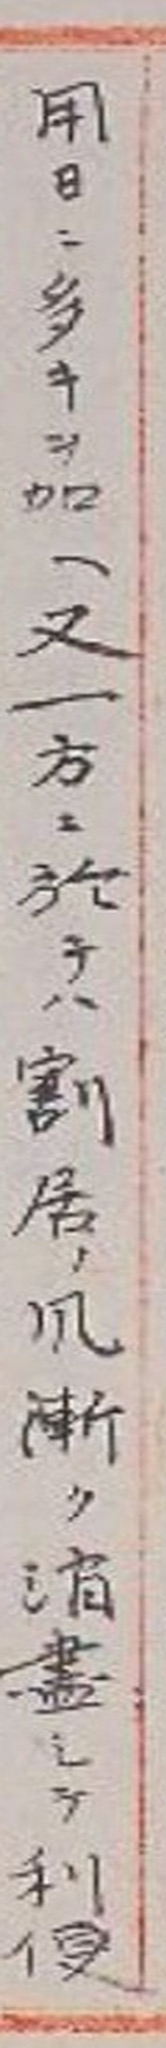用日ニ多キヲ加ヘ又一方ニ於テハ割居ノ風漸ク消尽シテ利便
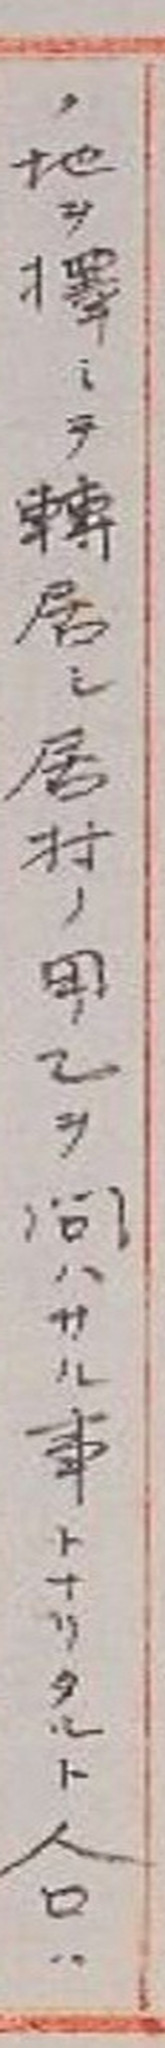ノ地ヲ択ミテ転居シ居村ノ甲乙ヲ問ハサル事トナリタルト人口ハ
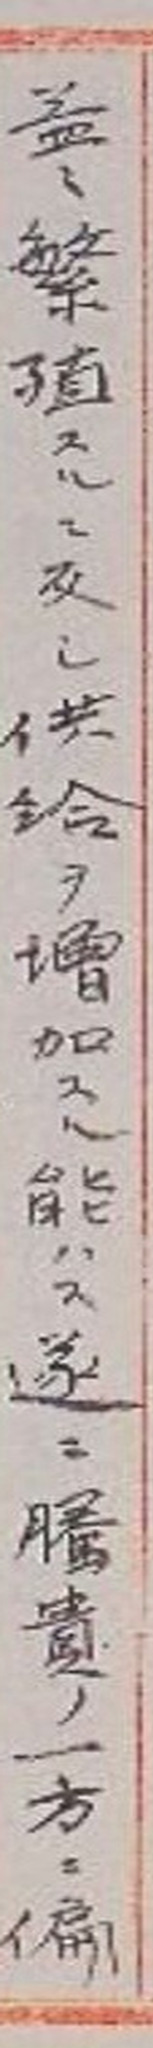益々繁殖スルニ反シ供給ヲ増加スル能ハス遂ニ騰貴ノ一方ニ偏
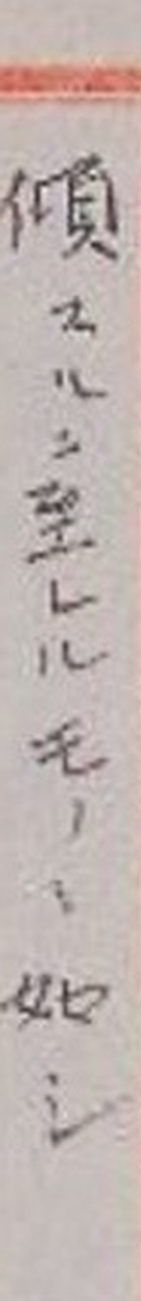傾スルニ至レルモノヽ如シ
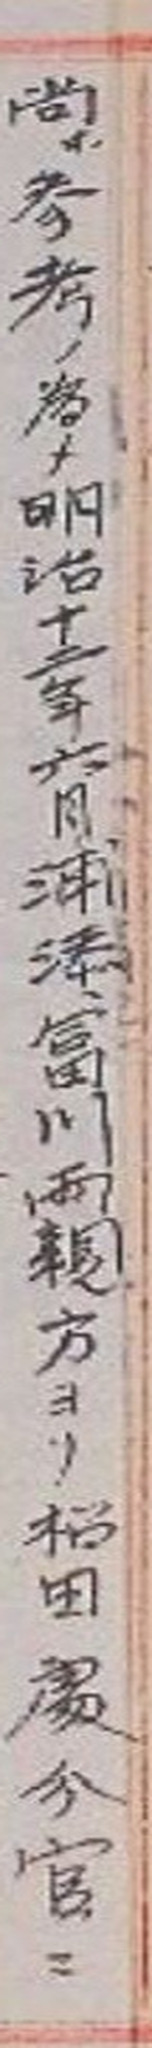尚ホ参考ノ為メ明治十二年六月浦添、冨川両親方ヨリ松田処分官ニ
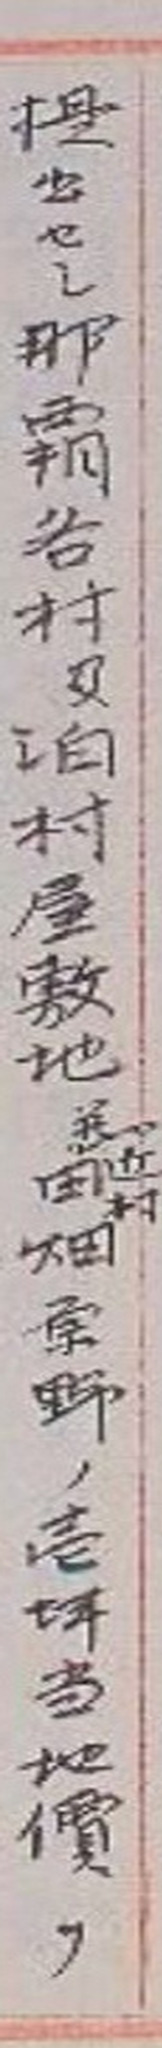提出セシ那覇各村及泊村屋敷地并近村田畑原野ノ壱坪当地価ヲ
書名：本県地価ノ高キ理由調書
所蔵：University of the Ryukyus Library
